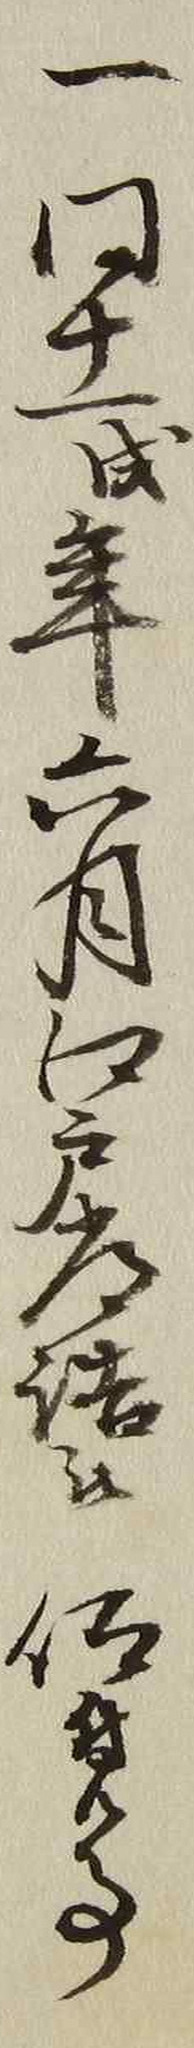一同十一戌年六月江戸常詰被仰付候事
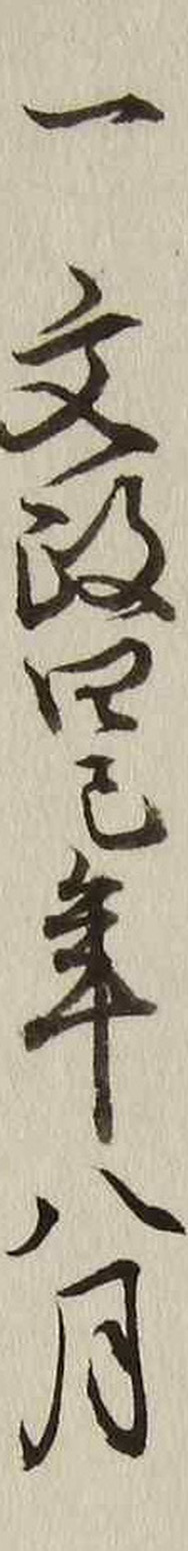一文政四巳年八月
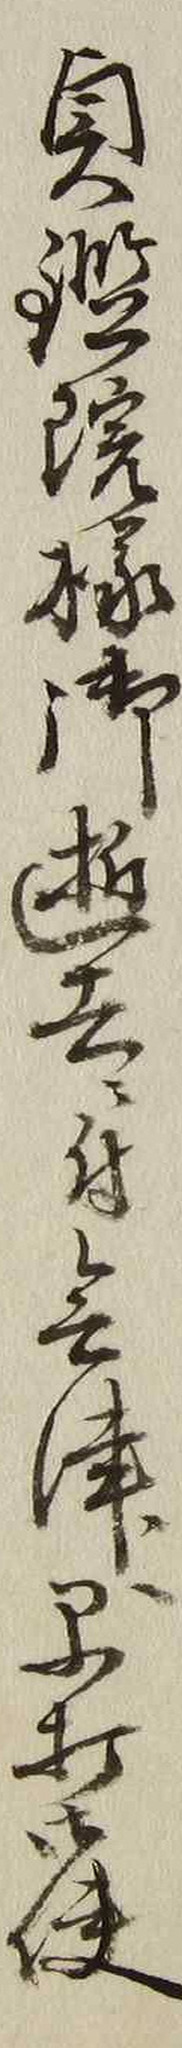貞鑑院様御逝去ニ付会津へ早打御使
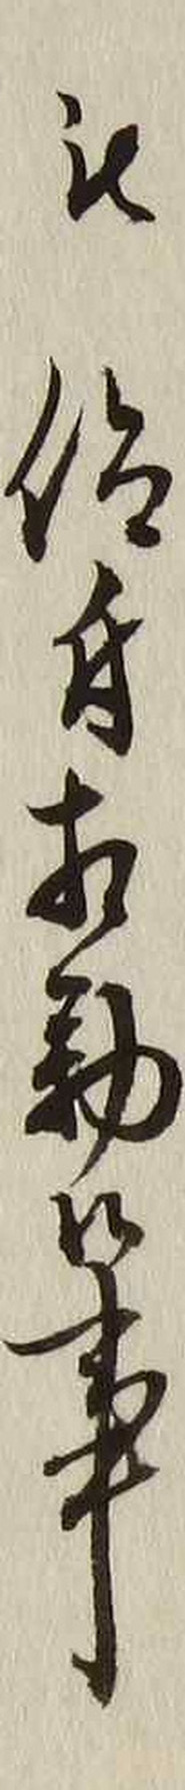被仰付相勤候事

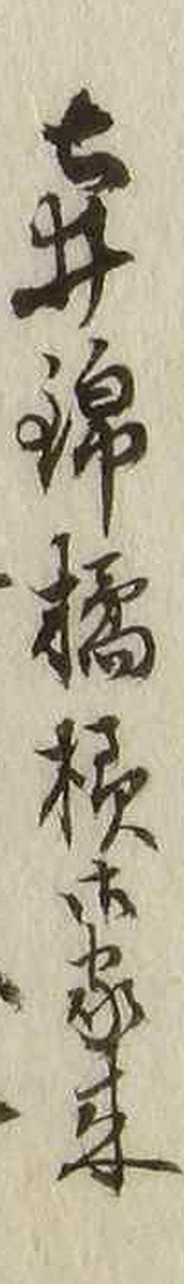女土井錦橘様御家来
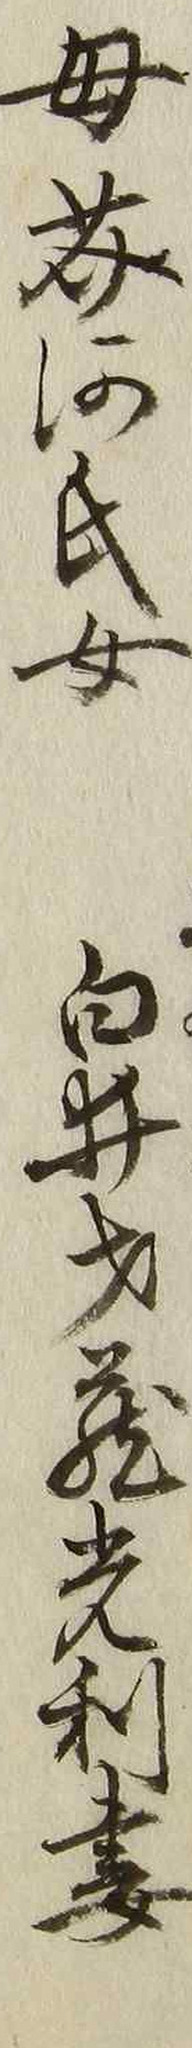母芥河氏女白井才蔵光利妻
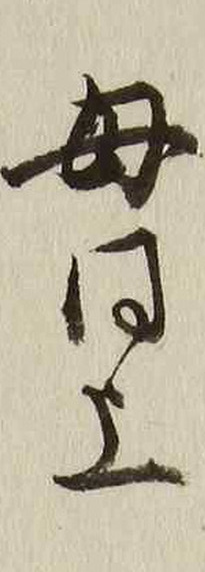母同上
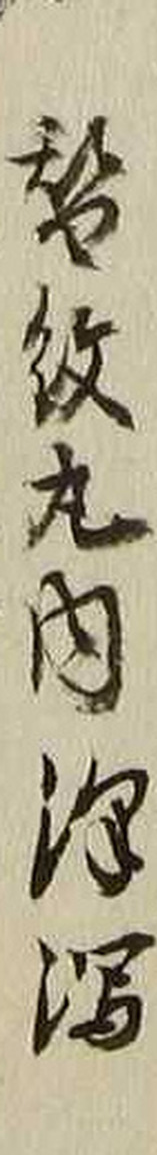替紋丸内沢瀉
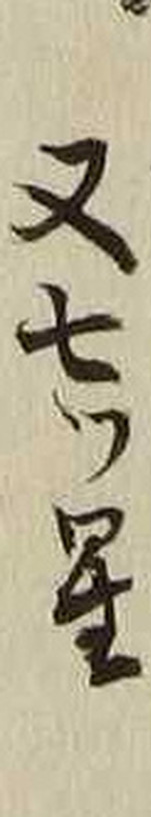又七ツ星
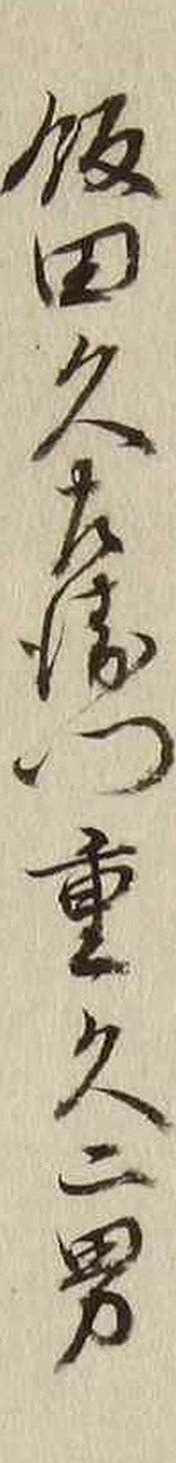飯田久左衛門重久二男
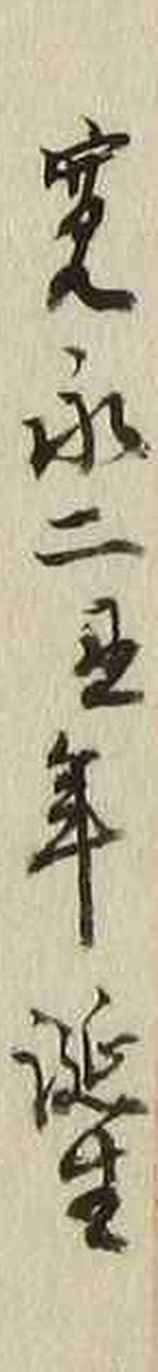寛永二丑年誕生
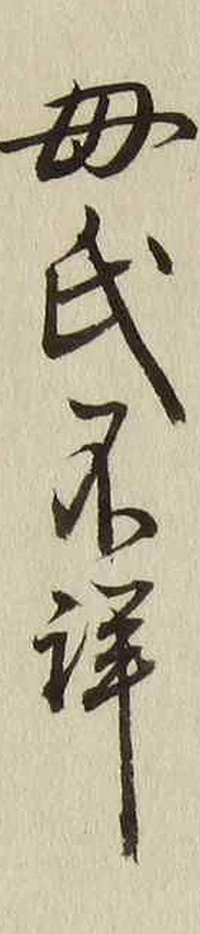母氏不詳
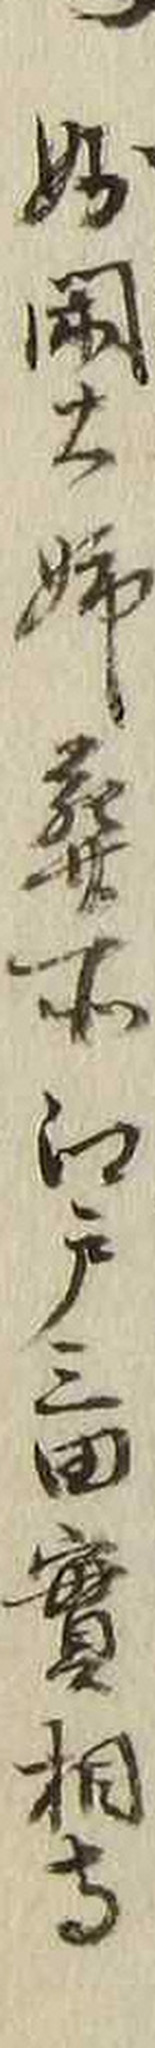妙閑大姉葬所江戸三田実相寺
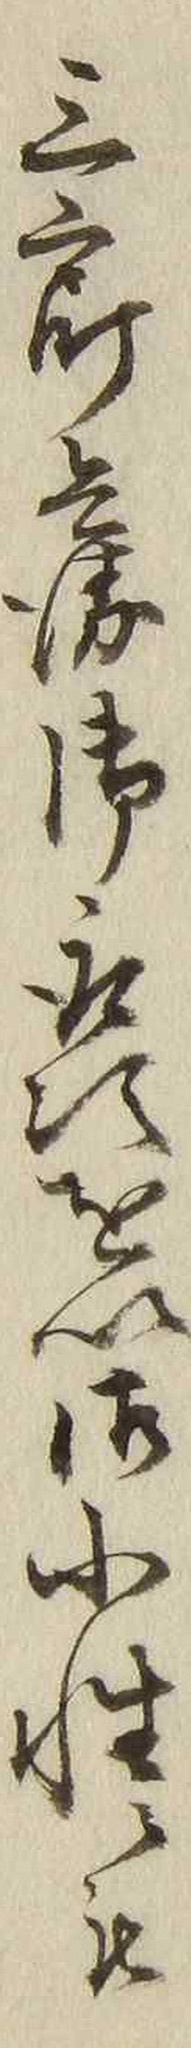三郎兵衛御取次を以御小性ニ被

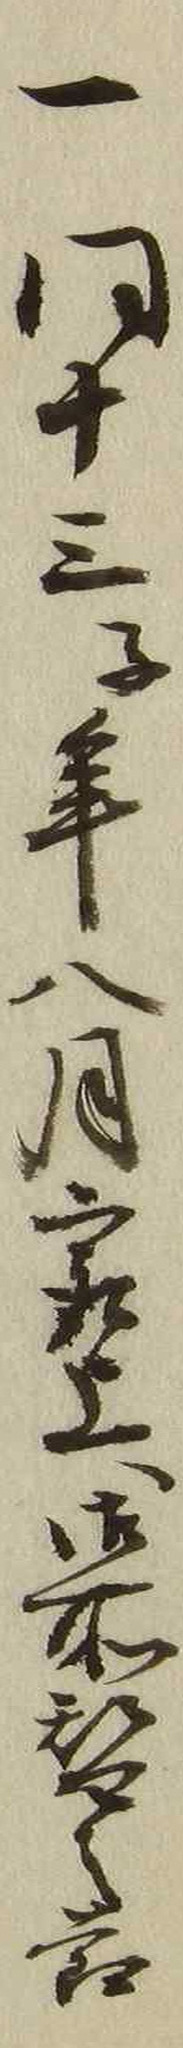一同十三子年八月最上へ御所替之節
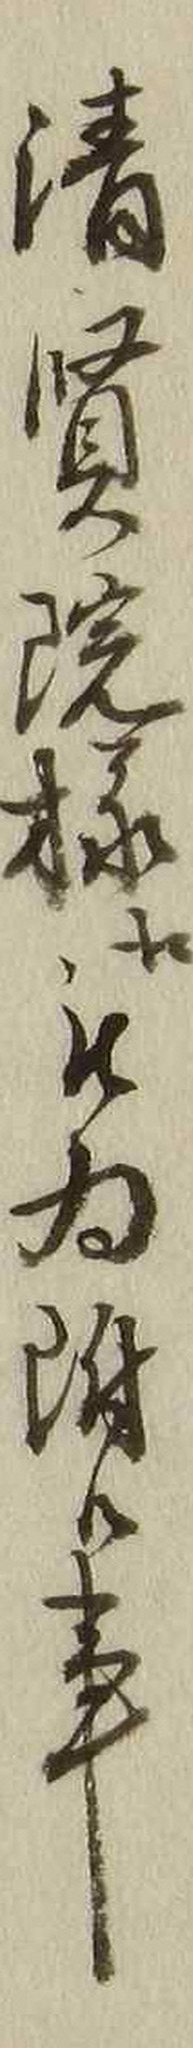清賢院様江被為附候事
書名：諸士系譜　巻之23　い之部23
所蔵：会津若松市立会津図書館
